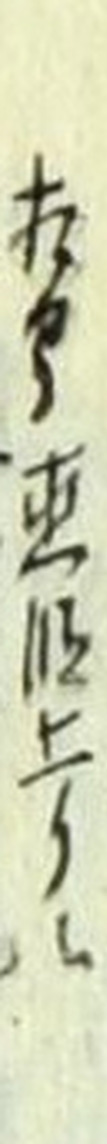拾匁直段上り候
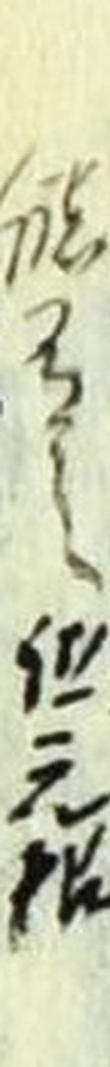儲有之但元銀
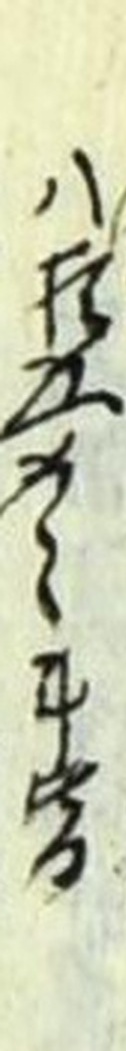八拾五貫計皆
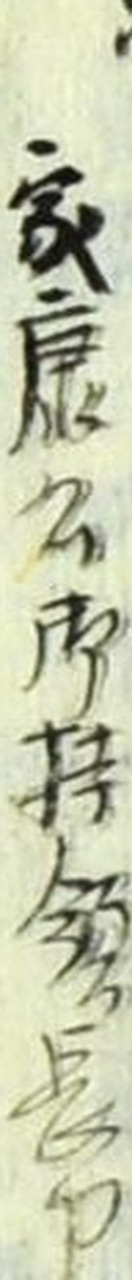家康公御持領長刀
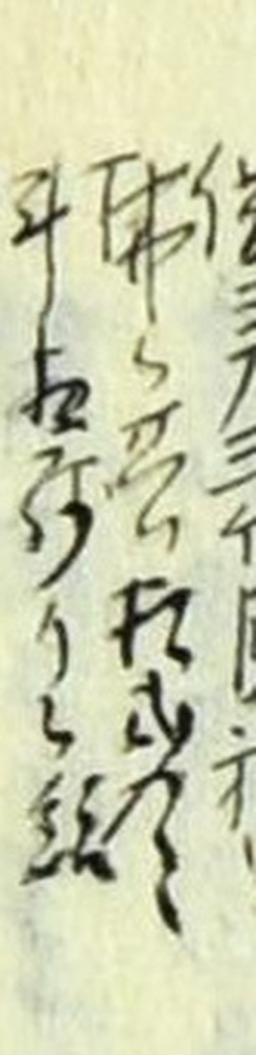計相残り候趣

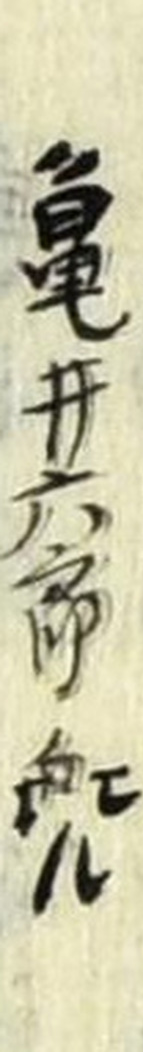亀井六郎兜
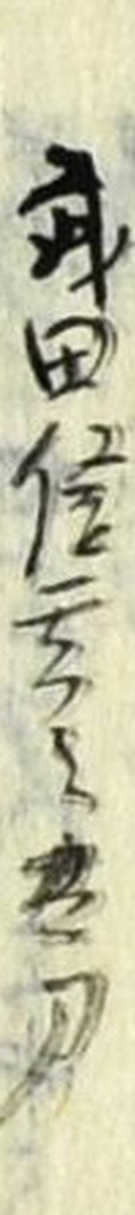武田信玄之太刀
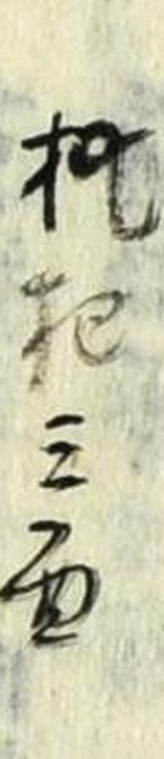枇杷三面
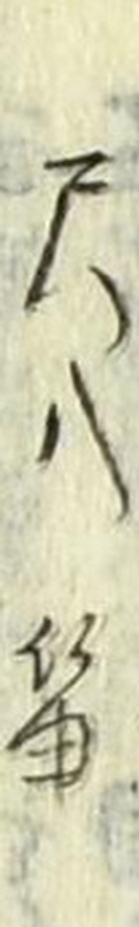尺八笛
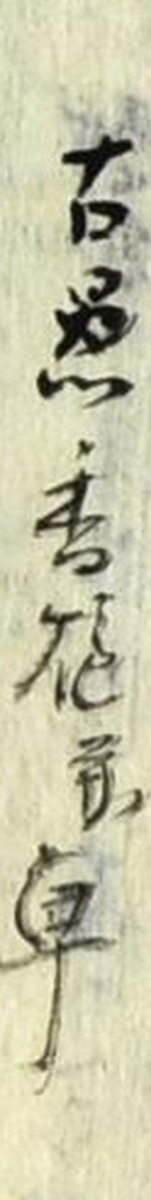古照香炉幷卓
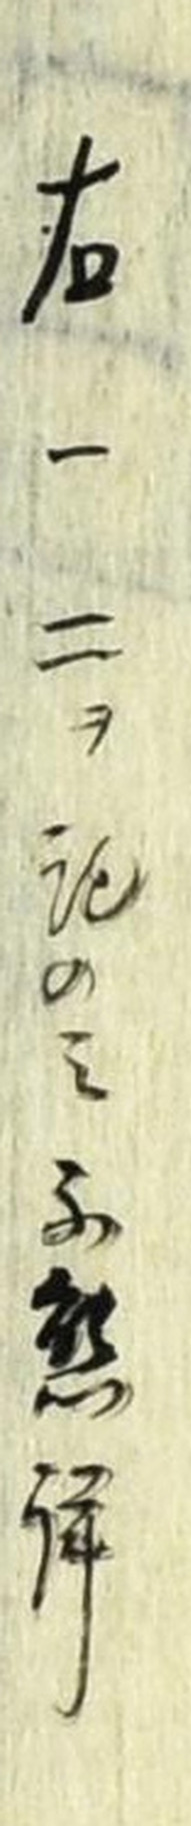右一二ヲ記のミ不態評
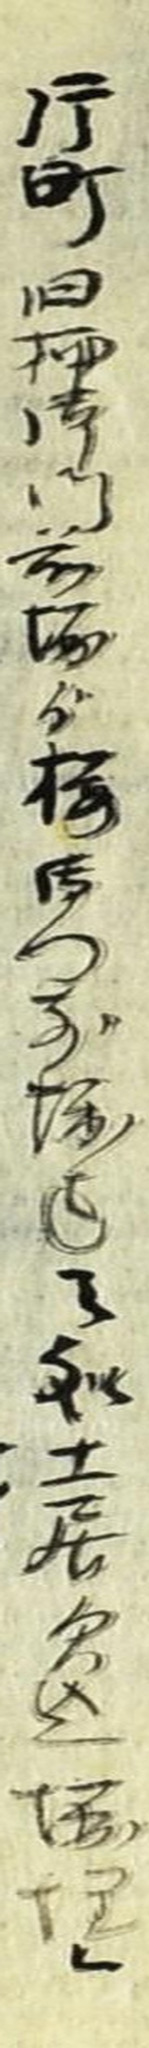片町旧柳御門前堀ゟ桜御門前堀迄之処土居欠込堀埋候
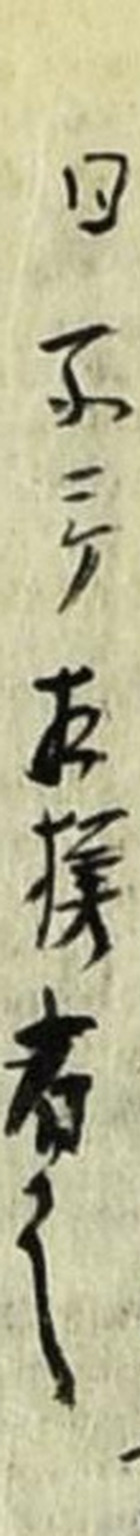同所ニテ相撲有之
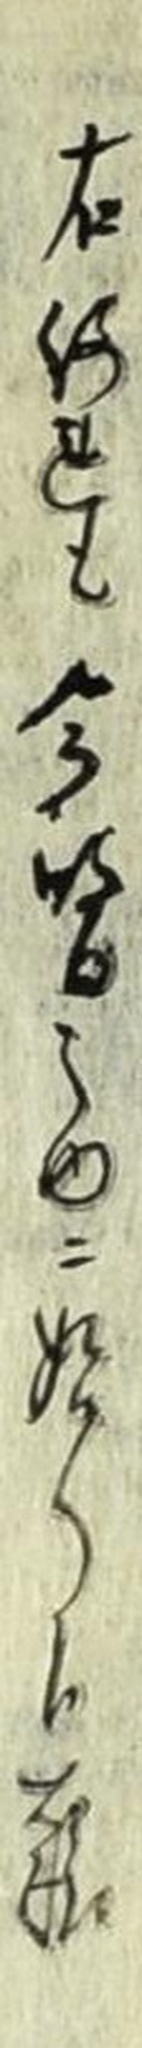右何れも今明日之内ニ始り候趣
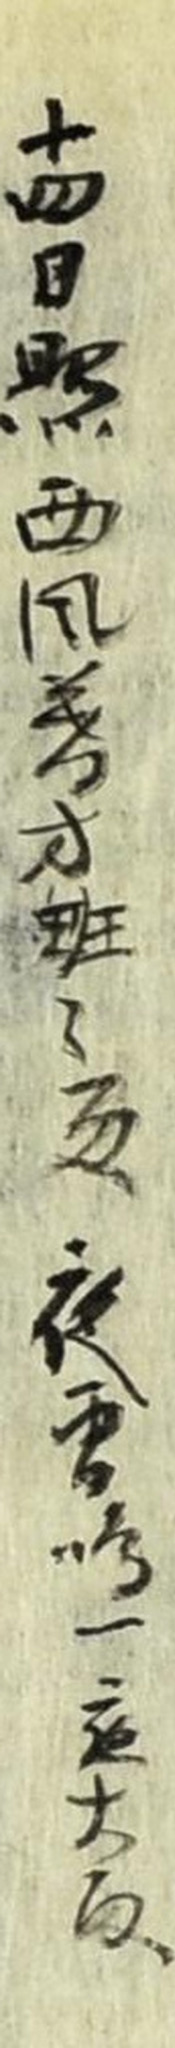十四日照西風暮方班々雨夜雷鳴一夜大雨
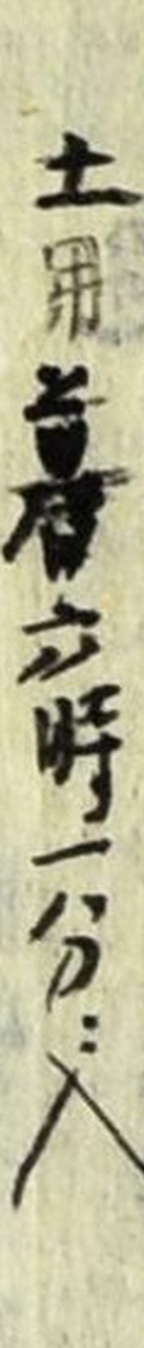土用暮六時一分ニ入
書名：（日記）
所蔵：福井県文書館 Fukui Prefectural Archives
